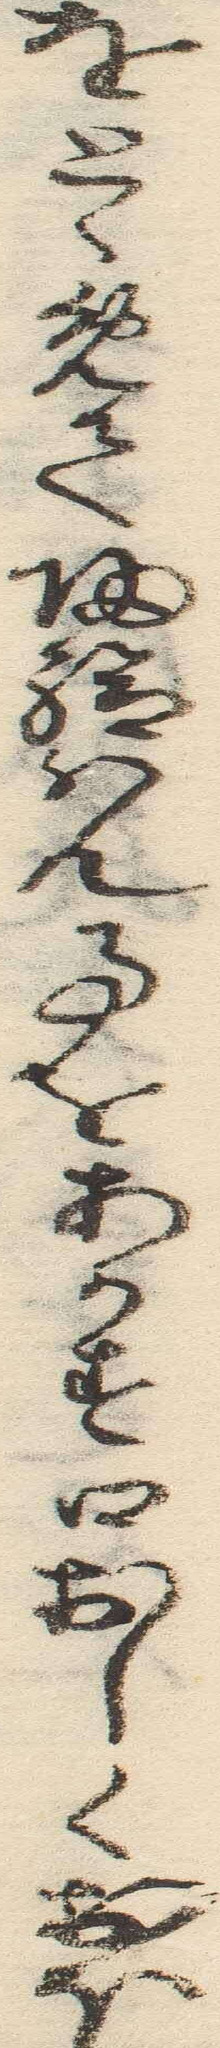をとゝめて帰給はん事をあかす口おしくおほ
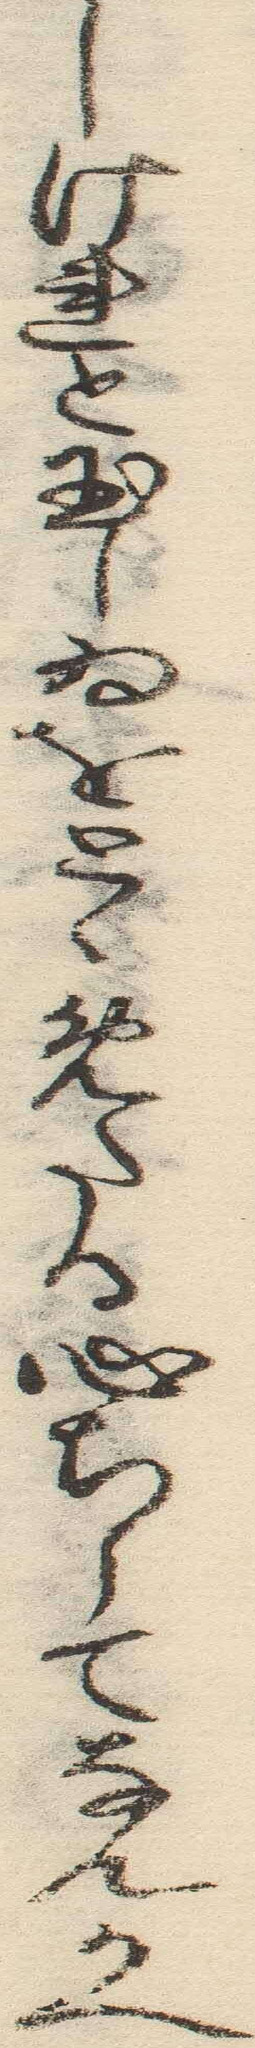しけれと玉しゐをとゝめたる心ちしてなんかへ
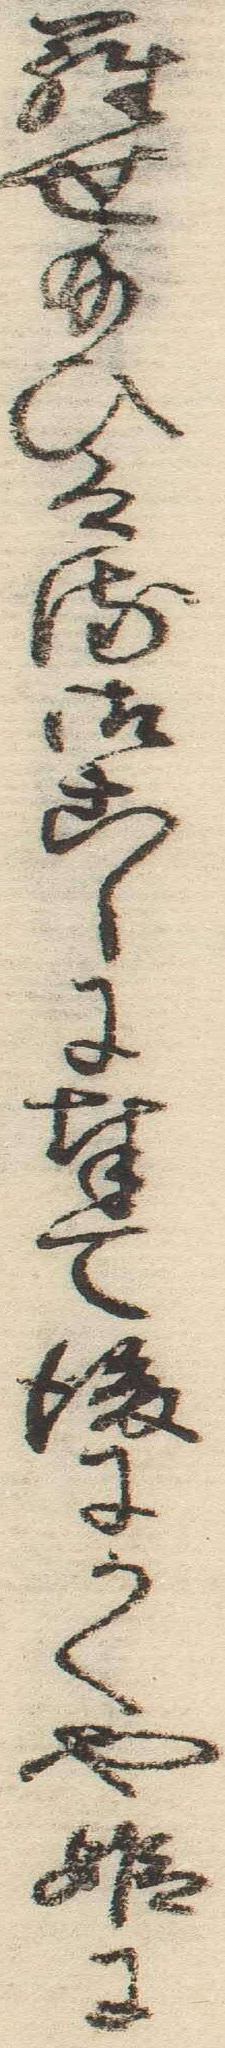らせ給ひける御こしに奉て後にかくや姫に
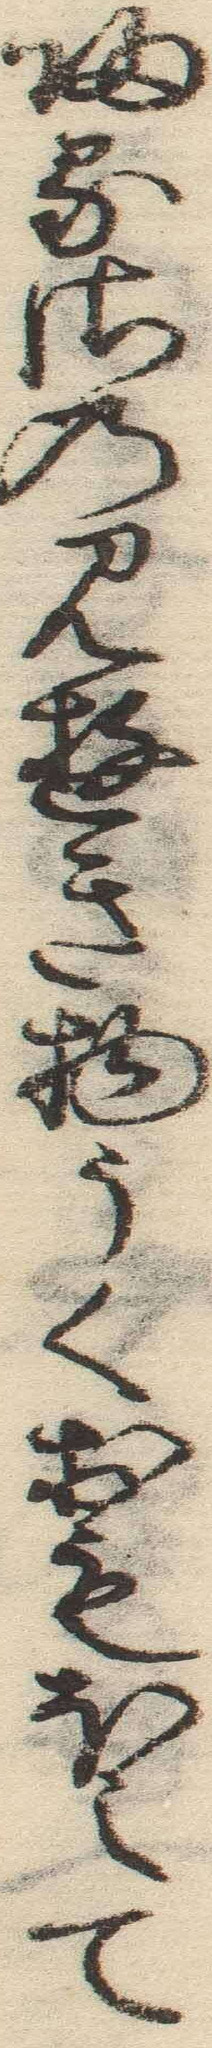帰るさのみゆき物うくおもほえて

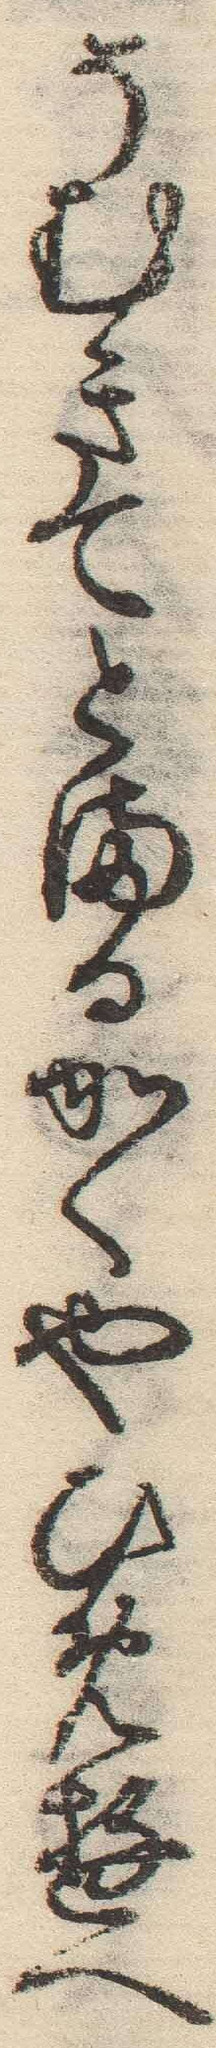そむきてとまるかくやひめゆへ
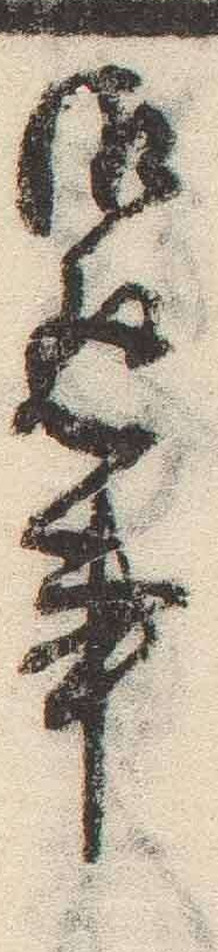御返事
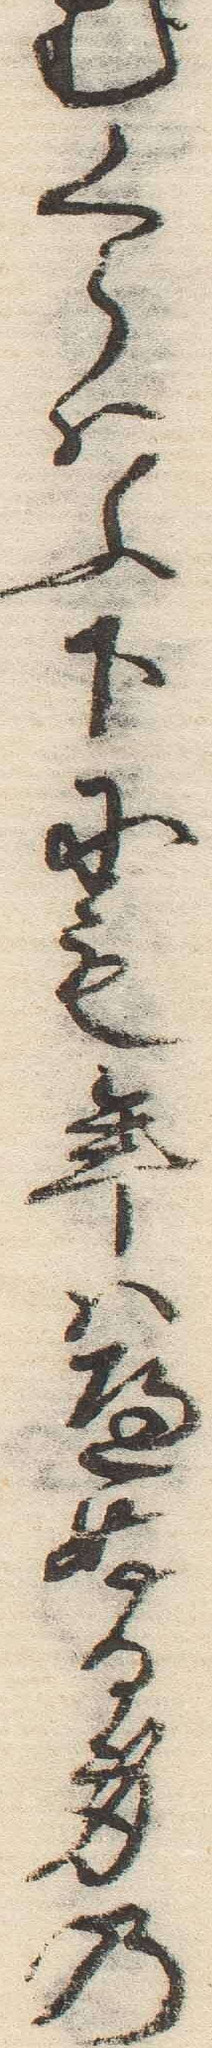むくらはふ下にも年はへぬる身の
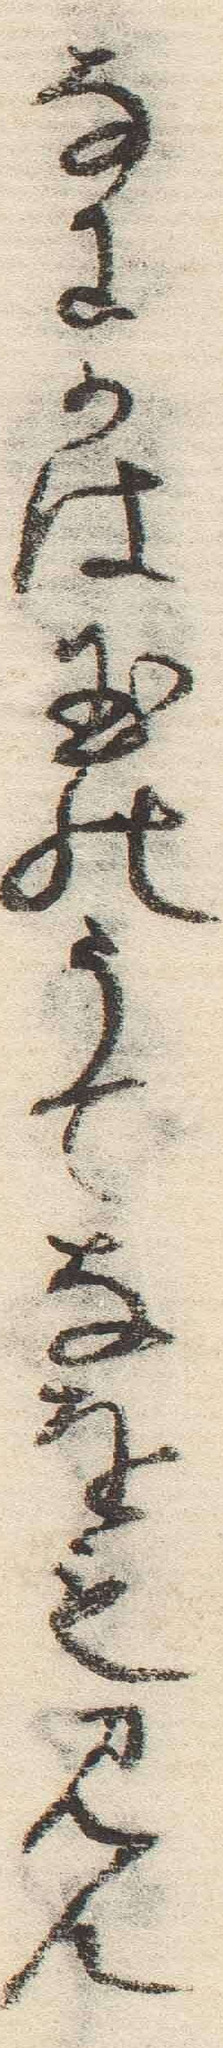なにかは玉のうてなをも見ん
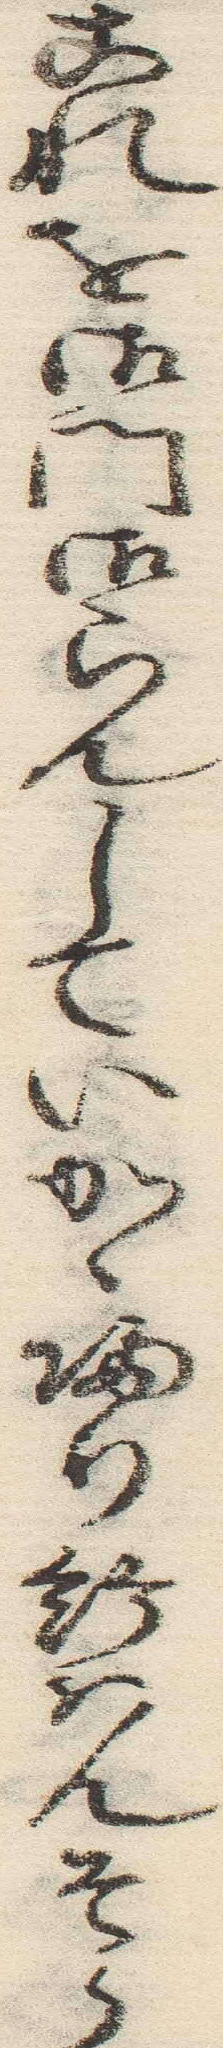これを御門御らんしていかゝ帰り給はんそら
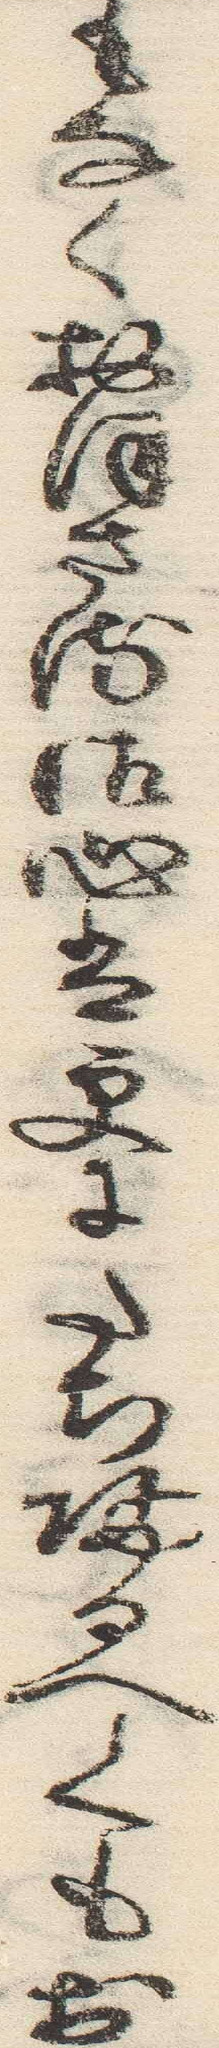もなくおほさる御心は更にたち帰るへくもお
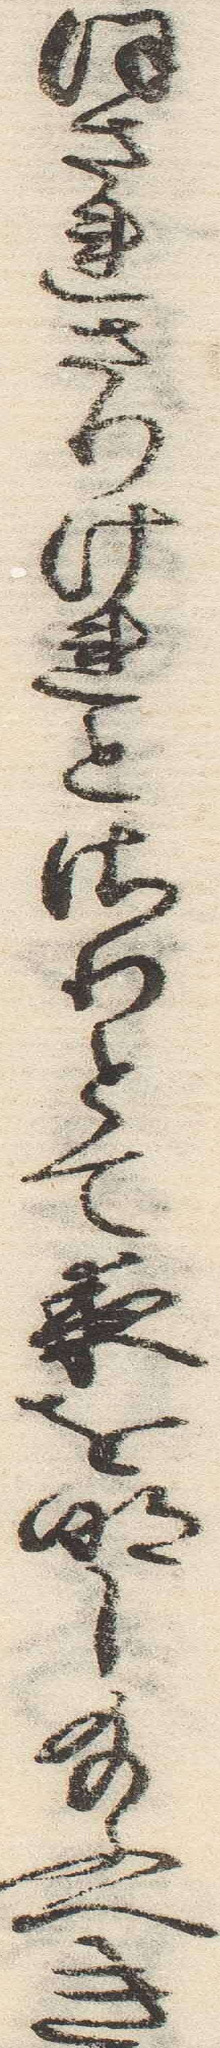ほされさりけれとさりとて夜を明し給ふへき
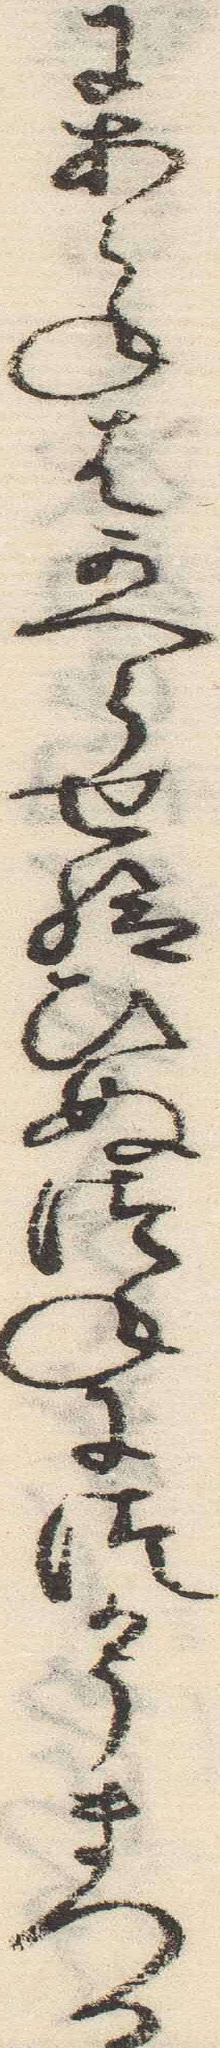にあらねはかへらせ給ひぬつねにつかうまつる
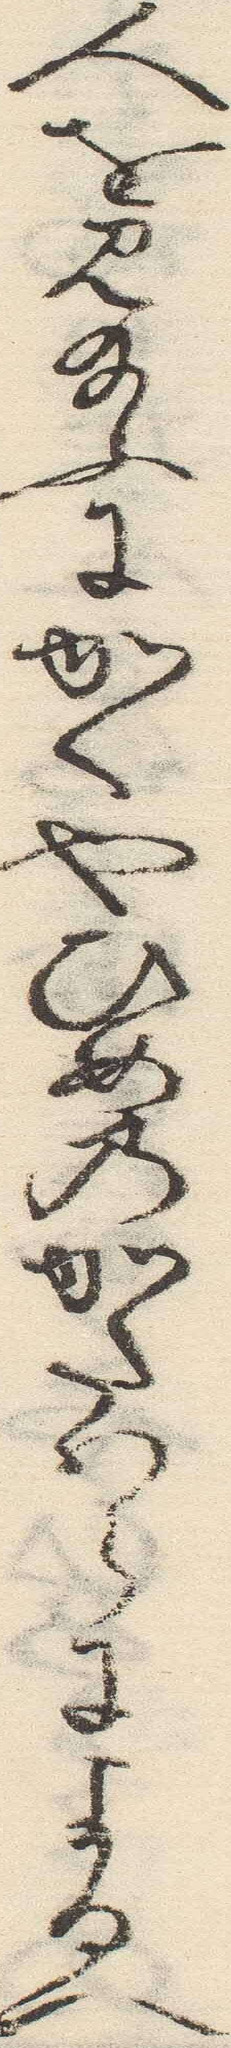人を見給ふにかくやひめのかたはらによるへ
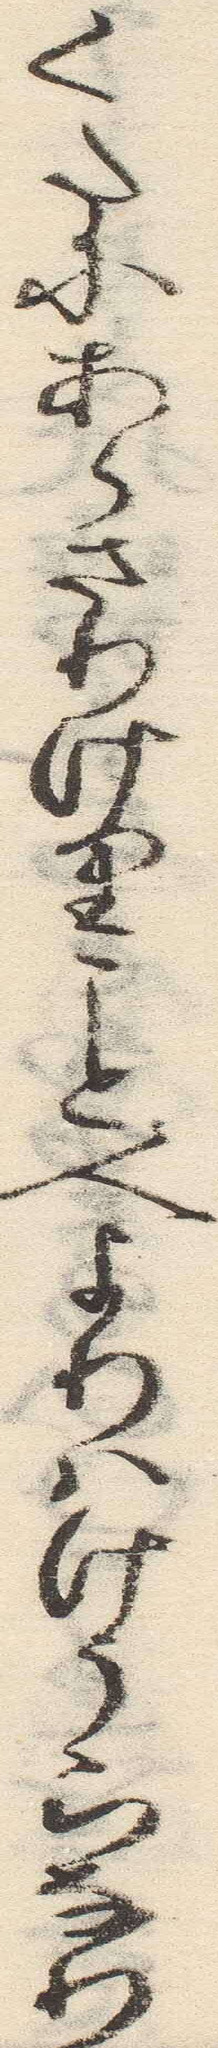くたにあらさりけりこと人よりはけうらなり
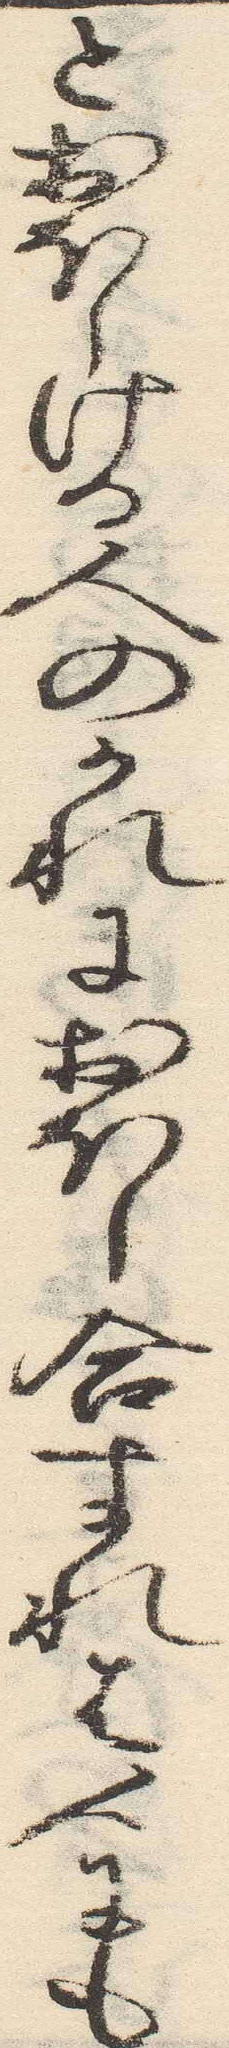とおほしける人のかれにおほし合すれは人にも
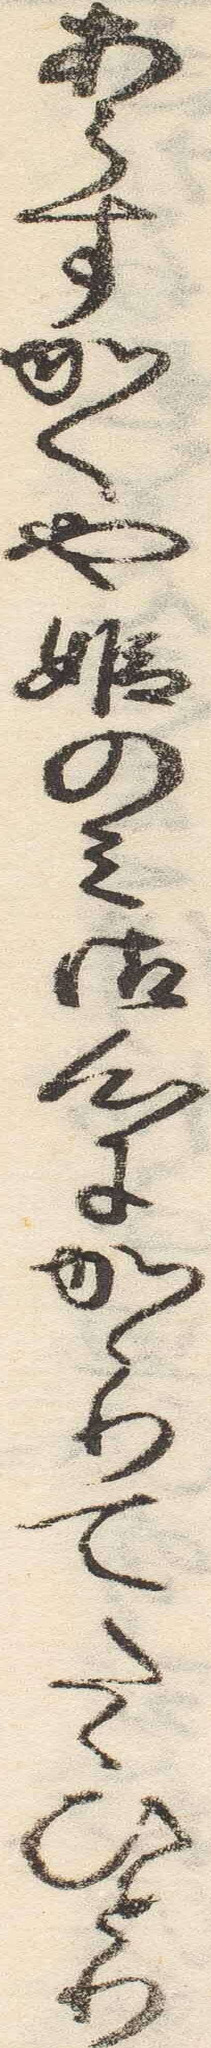あらすかくや姫のみ御心にかゝてたゝひとり
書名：竹取物語
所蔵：東京学芸大学附属図書館 国文学研究資料館
